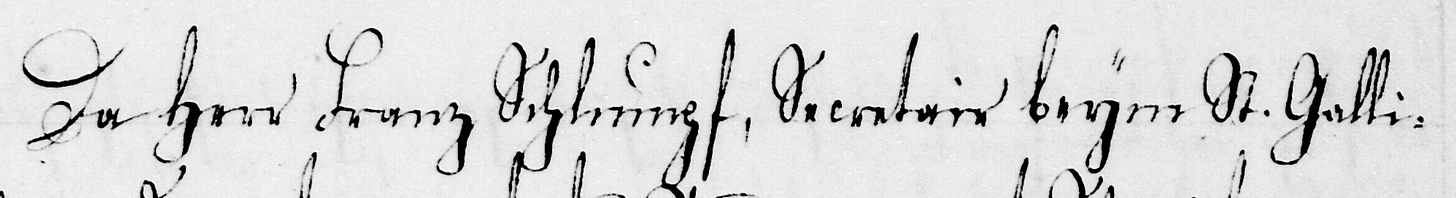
Da Herr Franz Schlumpf, Secretair beym St. Galli¬
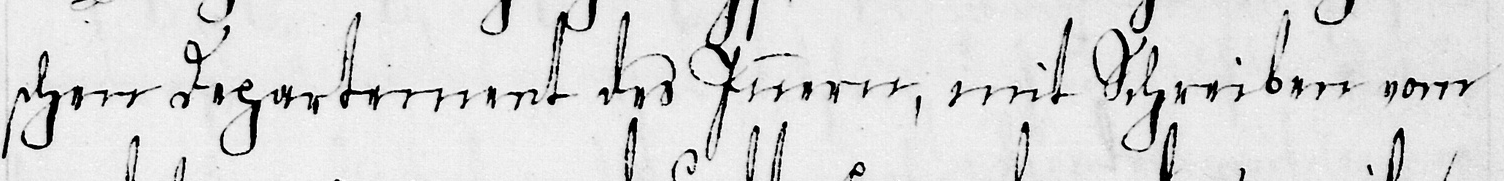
schen Departement des Innern, mit Schreiben vom
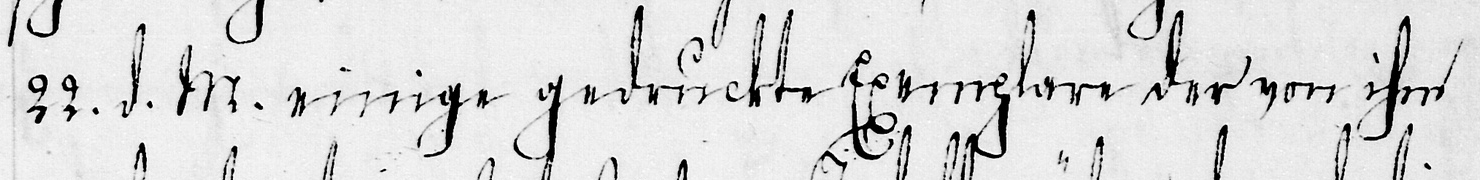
22. d. M. einige gedruckte Exemplare der von ihm
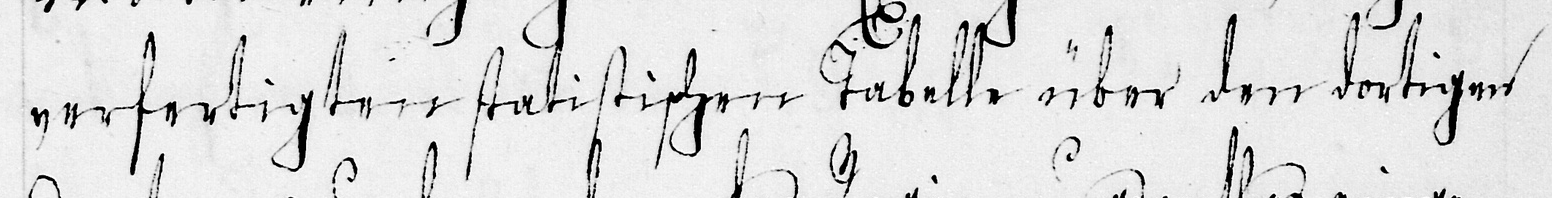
verfertigten statistischen Tabelle über den dortigen
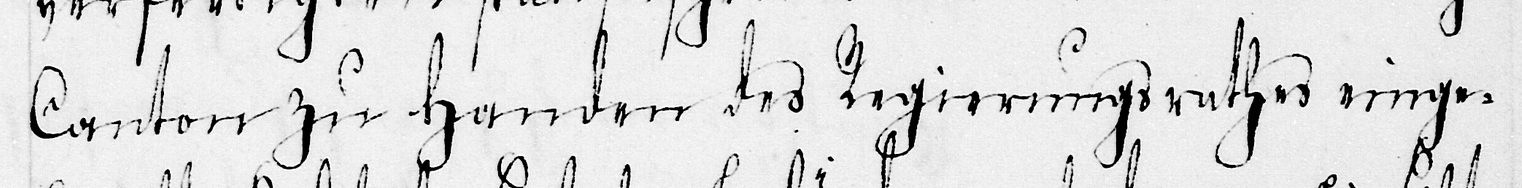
Canton zu Handen des Regierungsrathes einge¬
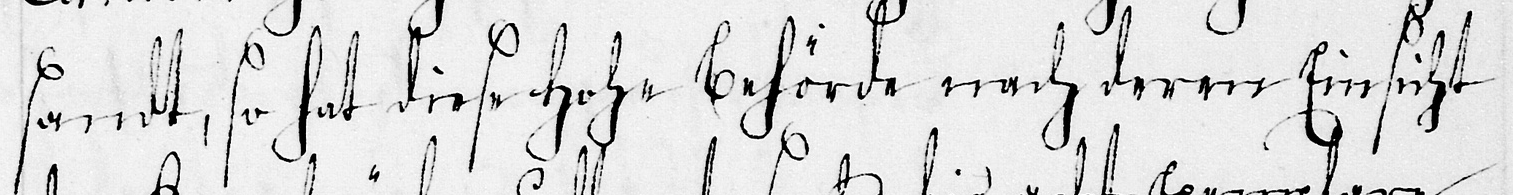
sandt, so hat diese Hohe Behörde nach deren Einsicht
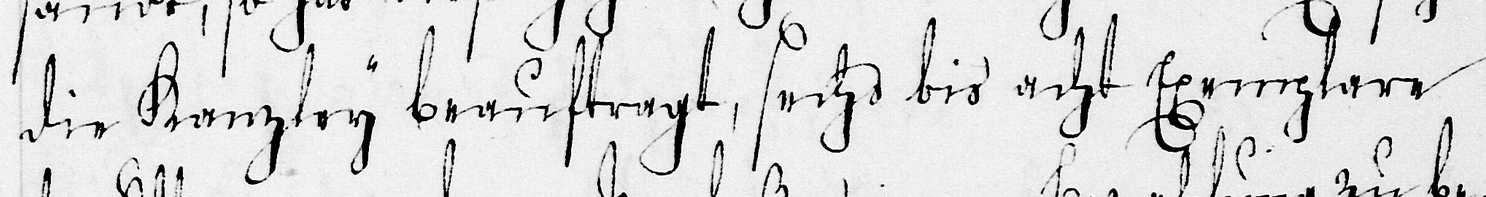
die Kanzley beauftragt, sechs bis acht Exemplare
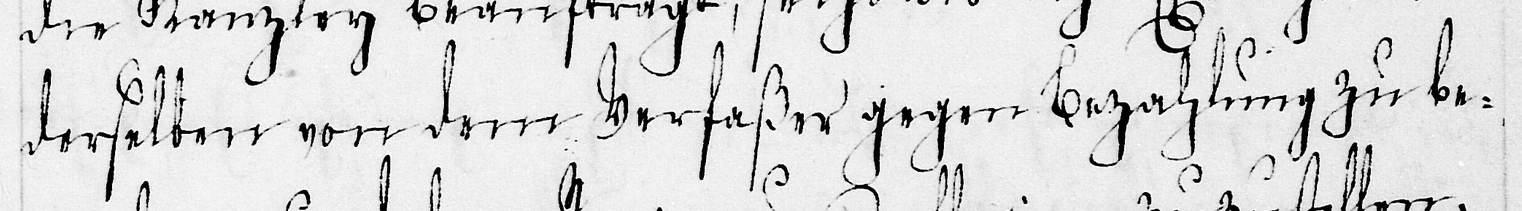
derselben von dem Verfaßer gegen Bezahlung zu be¬
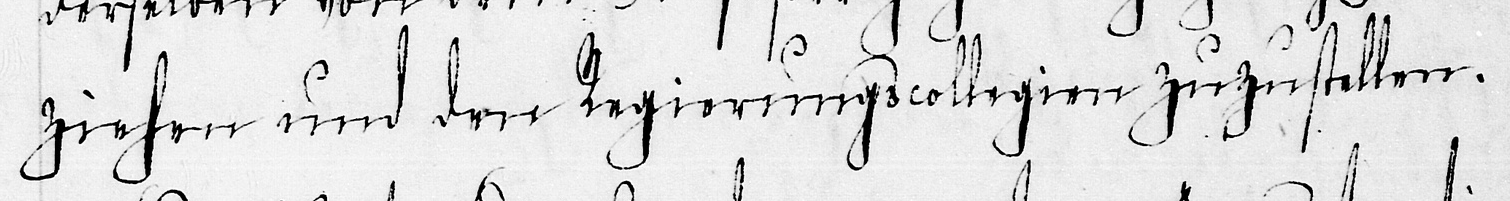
ziehen und den Regierungscollegien zuzustellen.
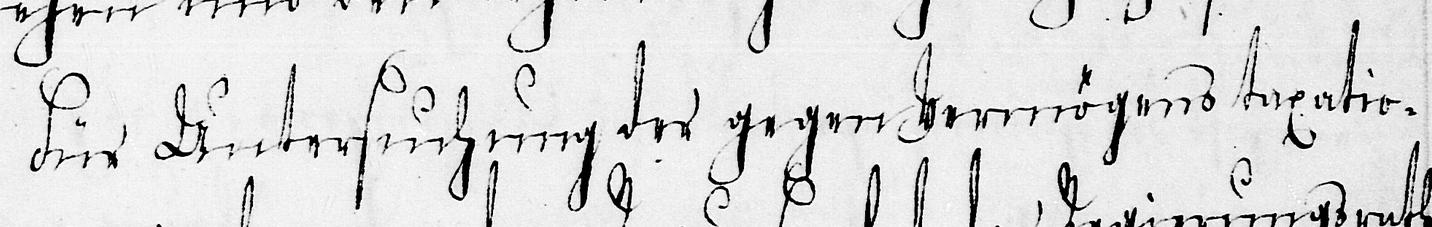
Für Untersuchung der gegen Vermögenstaxatio¬
